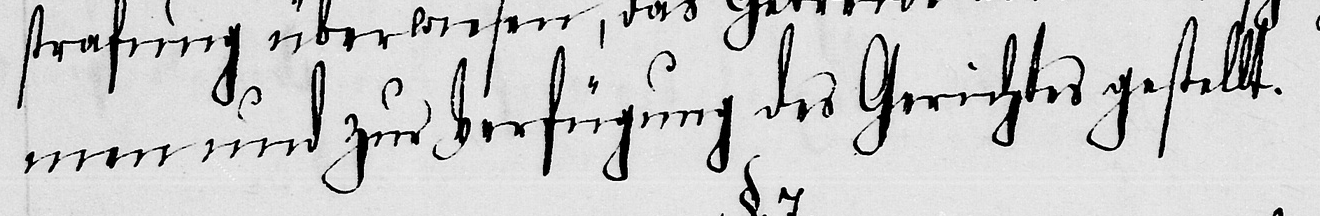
men und zur Verfügung des Gerichtes gestel¬
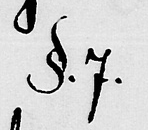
§.7.
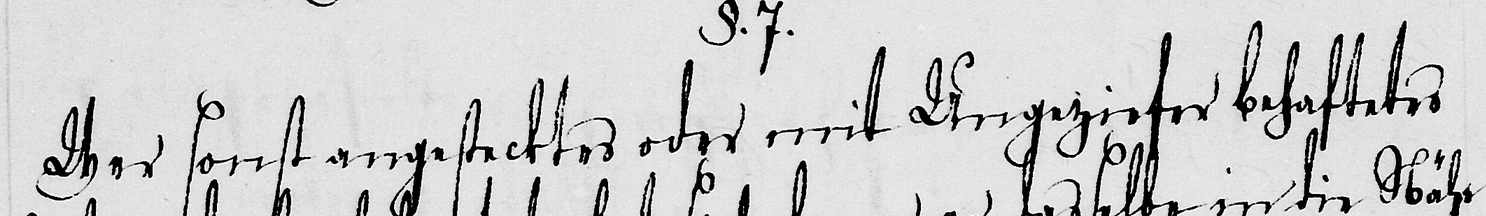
Wer sonst angestecktes oder mit Ungeziefer behaftetes
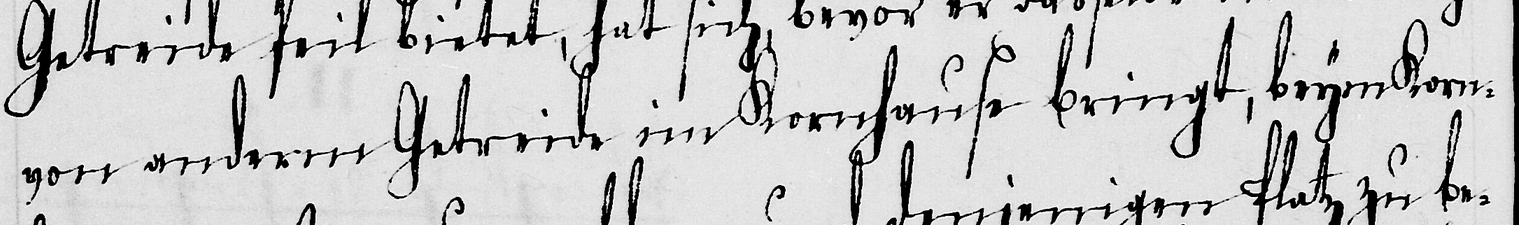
von anderm Getreide im Kornhause bringt, beym Korn¬
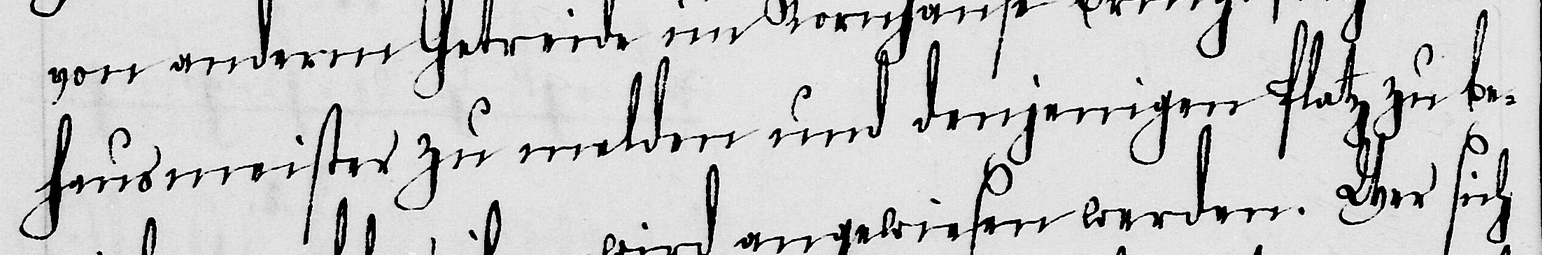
hausmeister zu melden und denjenigen Platz zu be¬
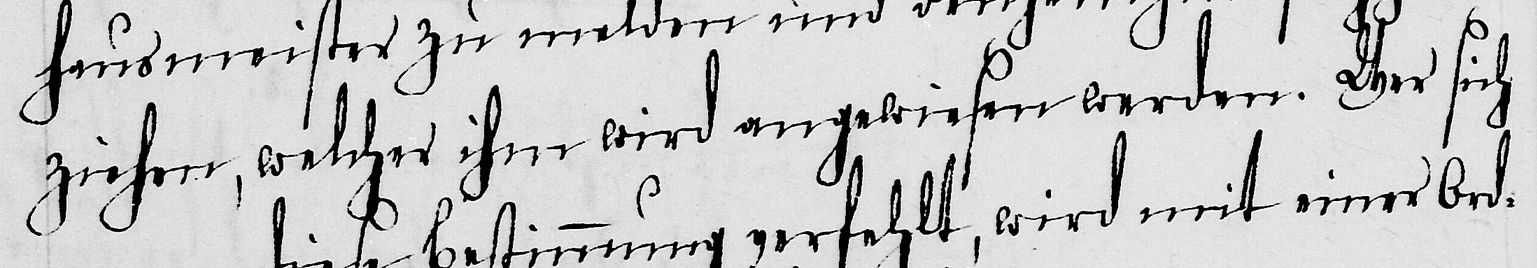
ziehen, welcher ihm wird angewiesen werden. Wer sich
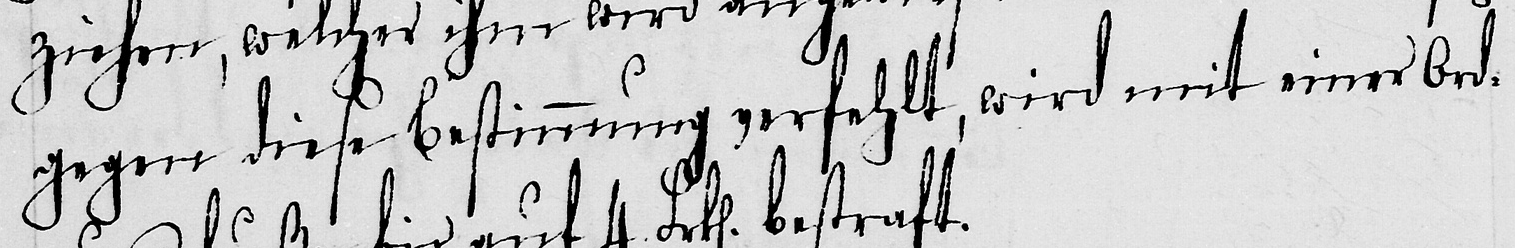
gegen diese Bestimmung verfehlt, wird mit einer Ord¬
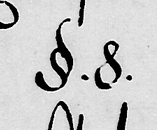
§.8.
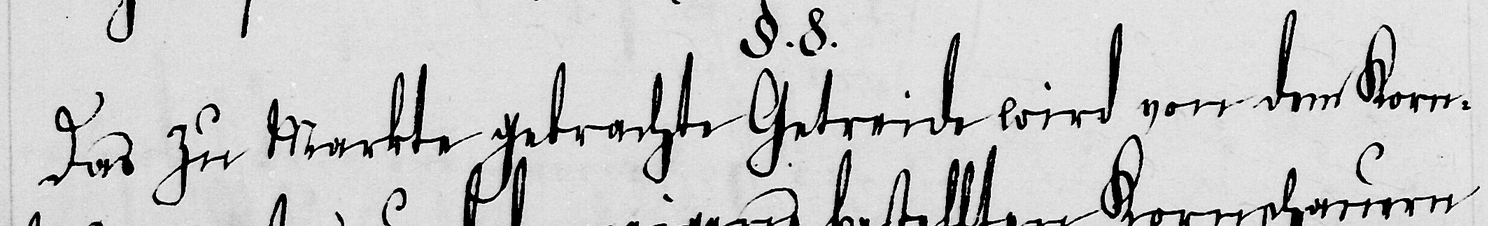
Das zu Markte gebrachte Getreide wird von dem Korn¬
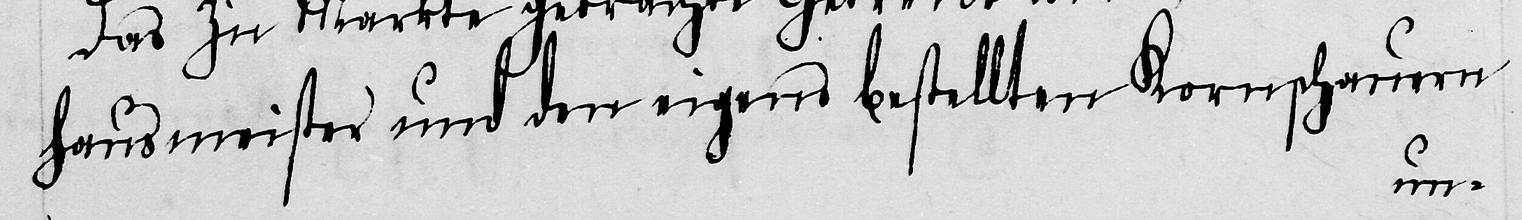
hausmeister und den eigens bestellten Kornschauern
